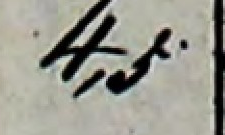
4,5
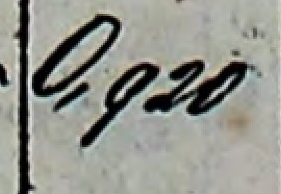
0,920
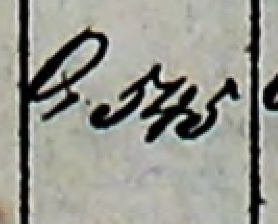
0,545
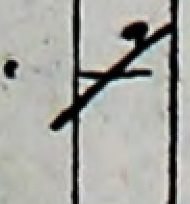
7
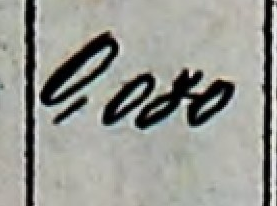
0,080
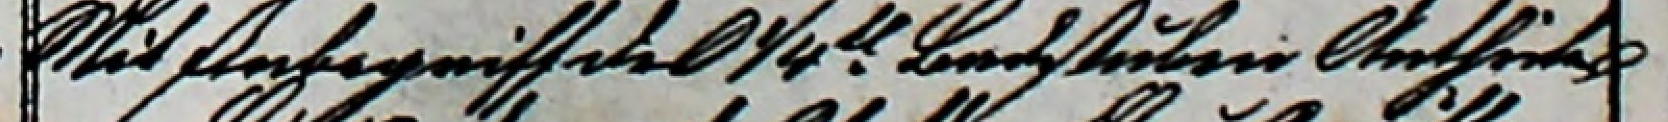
Mit Inbegriff des 1/4 ? Badstuben Antheiles
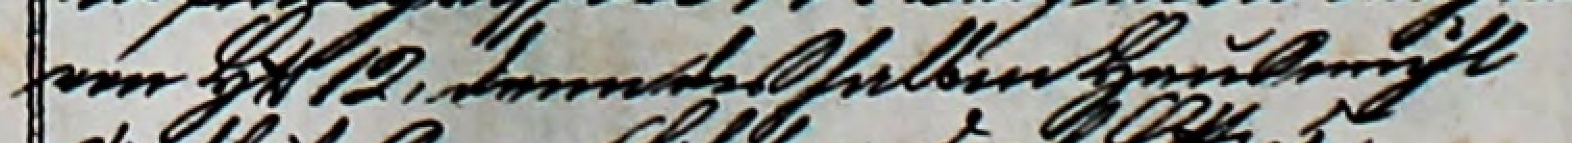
von Hn 12, Denn des halben Hausmühl
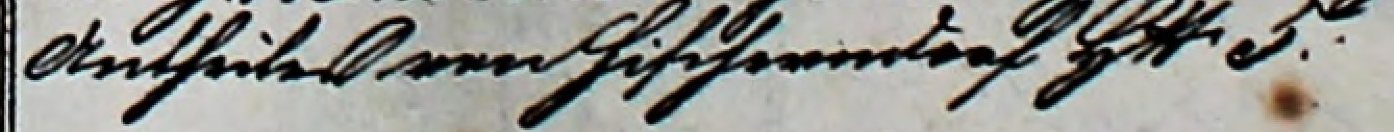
Antheiles von Fischereden Hn 5.
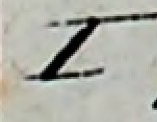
I
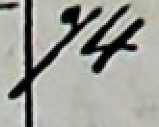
74
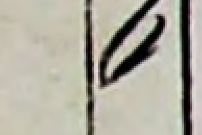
6
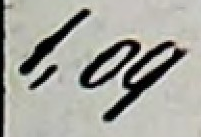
1,09
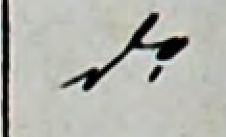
do
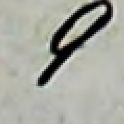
9
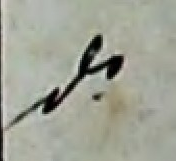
do
